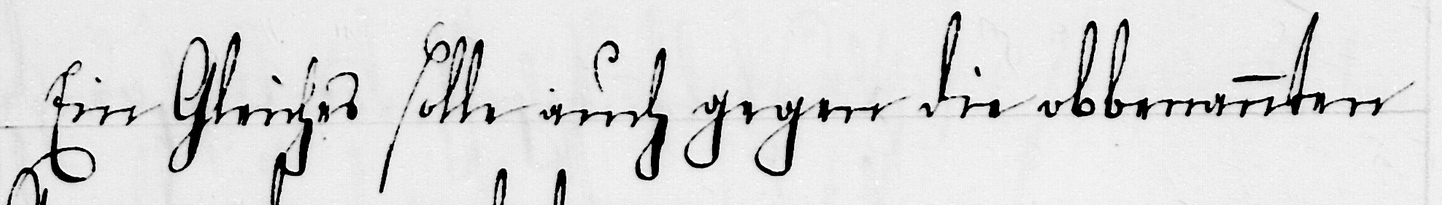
Ein Gleiches solle auch gegen die obbenannten
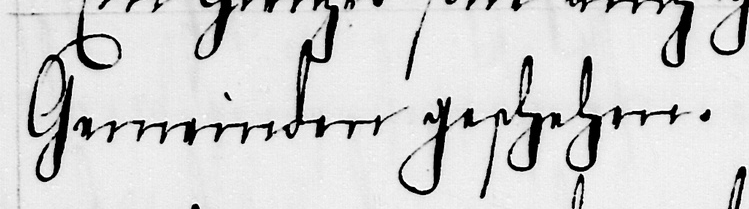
Gemeinden geschehen.
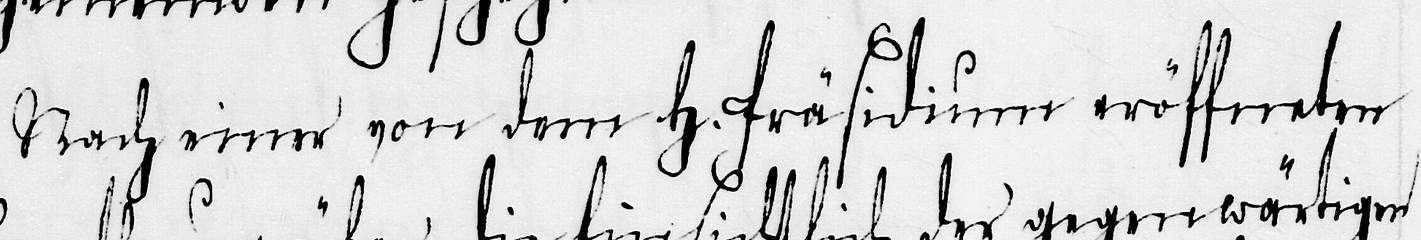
Nach einer von dem H. Präsidium eröffneten
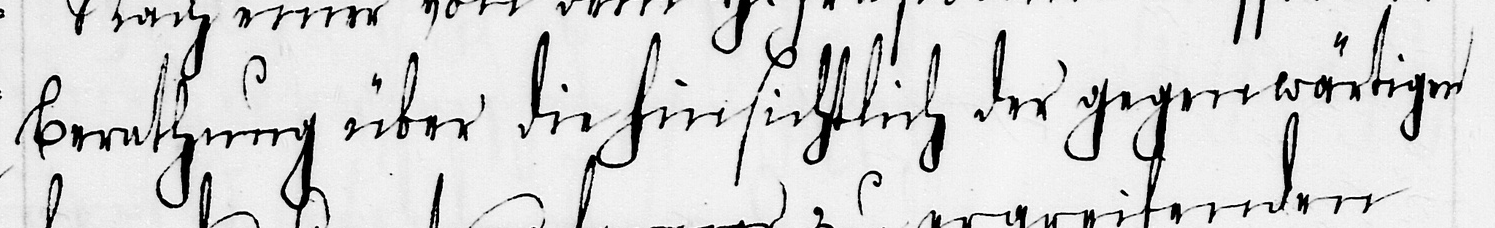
Berathung über die hinsichtlich der gegenwärtigen
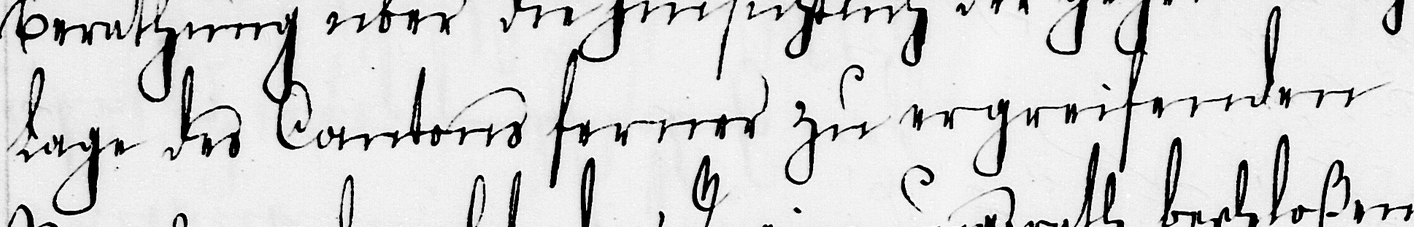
Lage des Cantons ferner zu ergreifenden
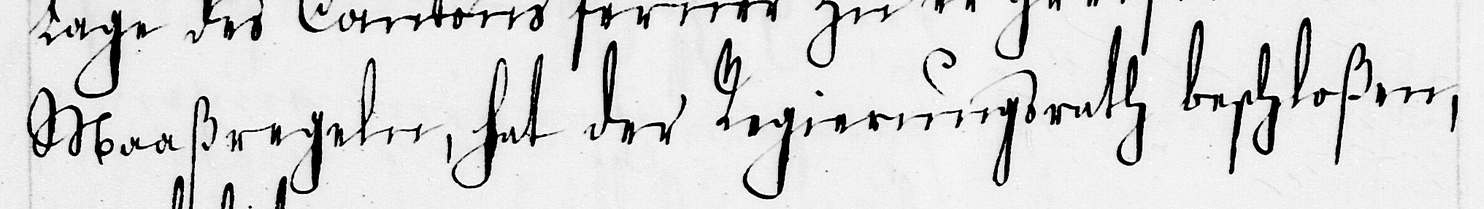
Maaßregeln, hat der Regierungsrath beschloßen,
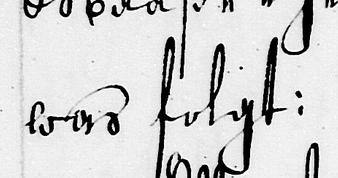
was folgt:
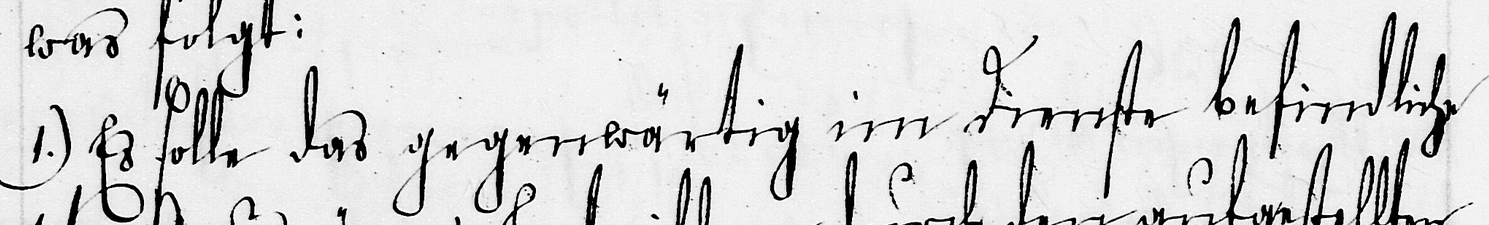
Es solle das gegenwärtig im Dienste befindliche
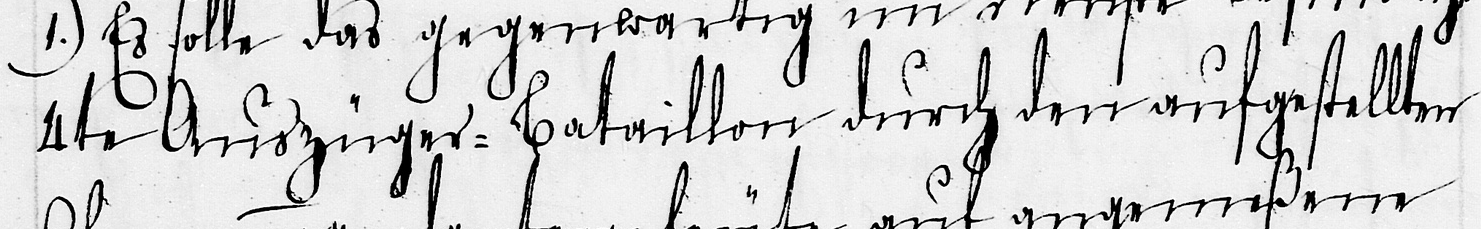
4te Auszüger-Batillon durch den aufgestellten
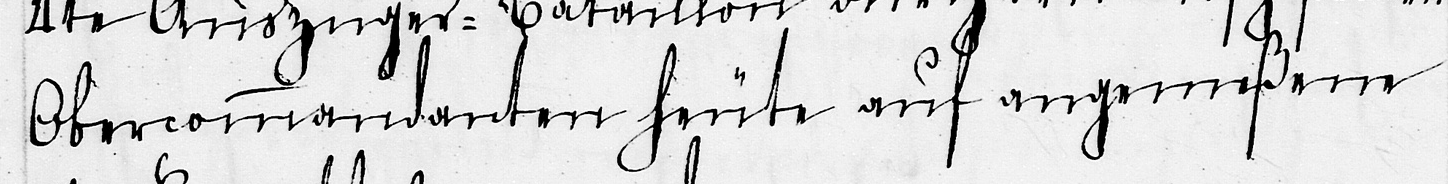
Obercommandanten heute auf angemeßene
